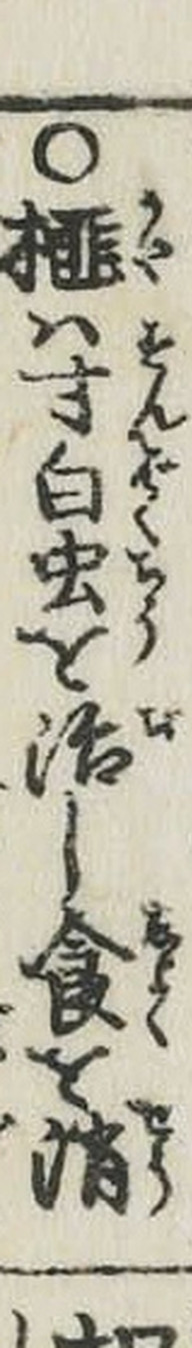○榧は寸白虫を治し食を消
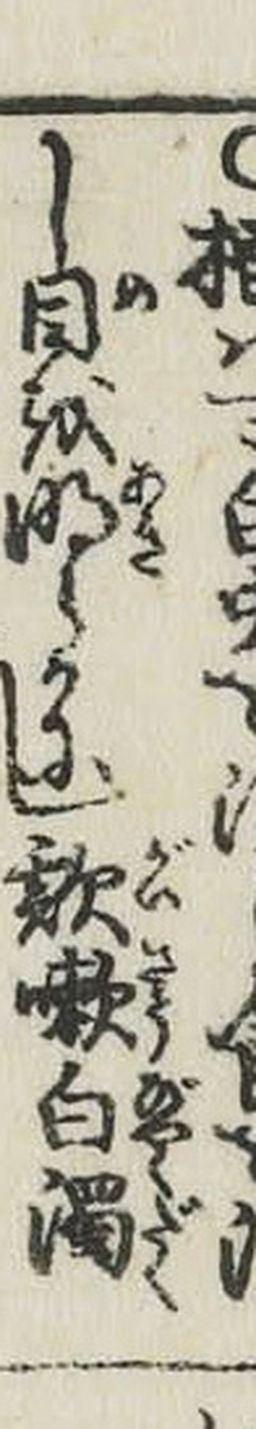し目を明らかにし咳嗽白濁
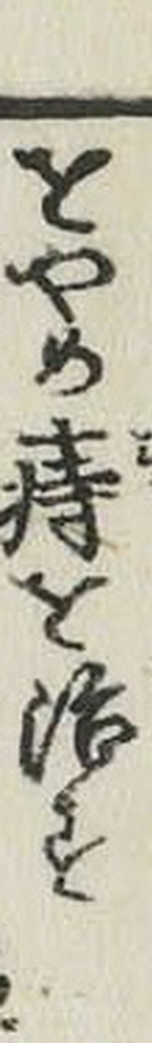をやめ痔を治す
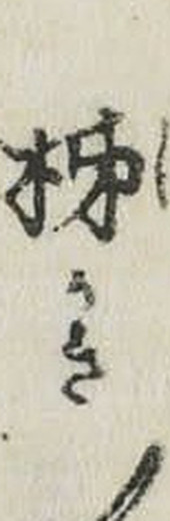柿かき
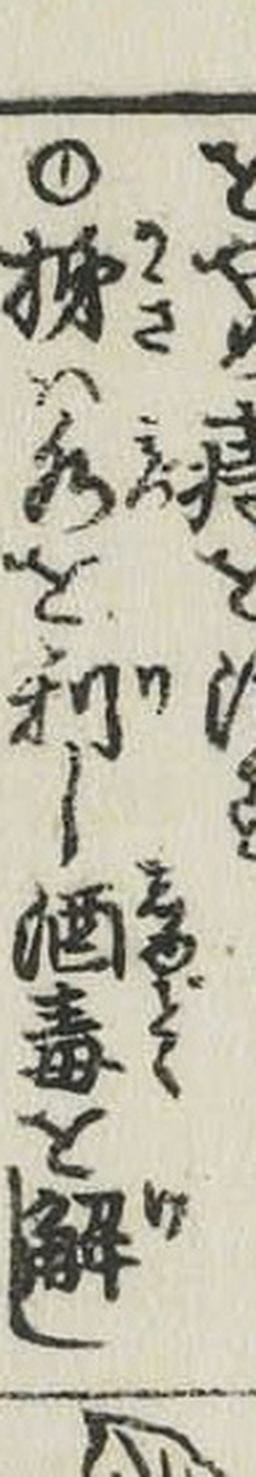○柿は水を利し酒毒を解し
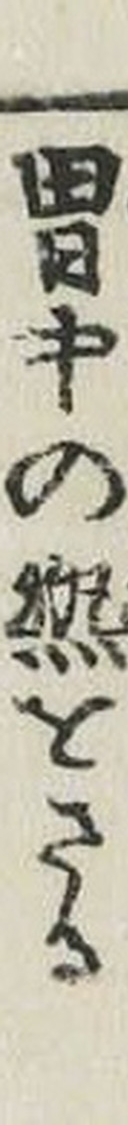胃中の熱をさる
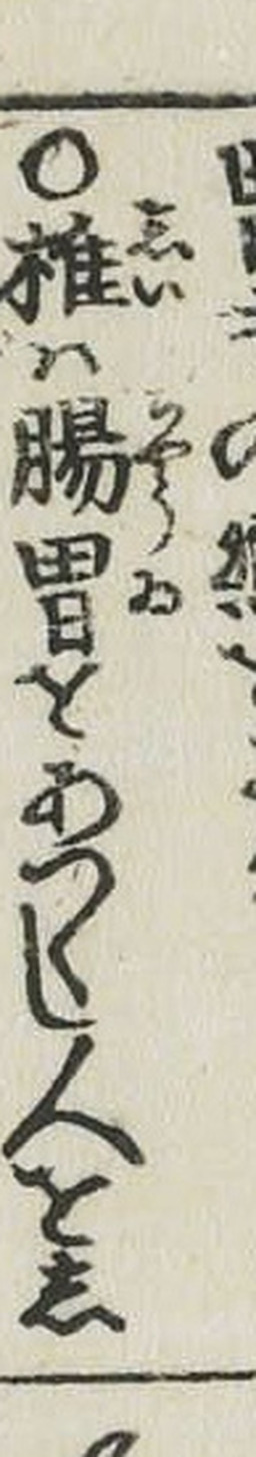○椎は腸胃をあつくし人をし
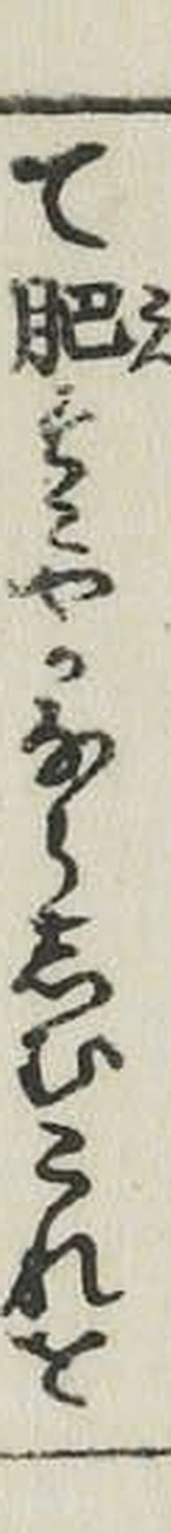て肥すこやかならしむこれを
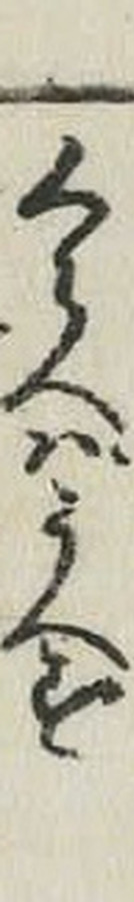くらへばうへず
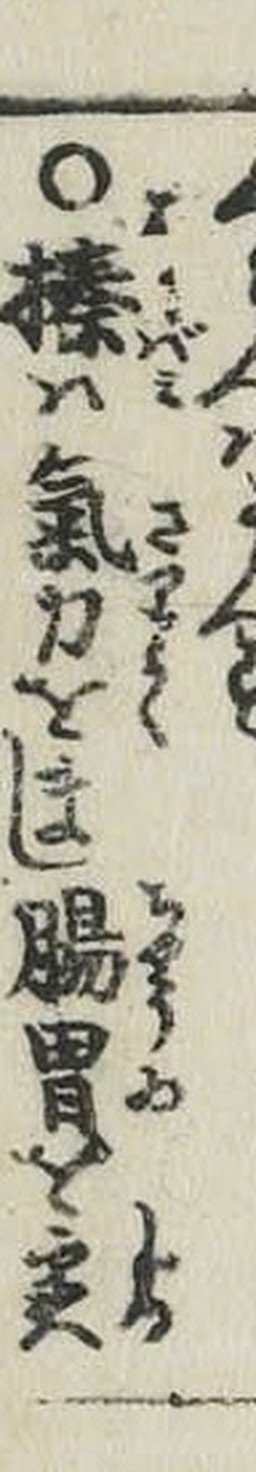○榛は気力をまし腸胃を実

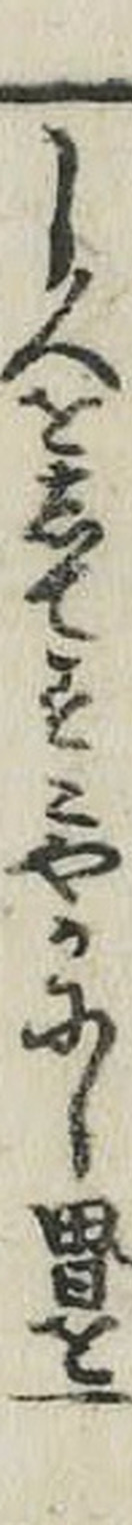し人をしてすこやかにし胃を
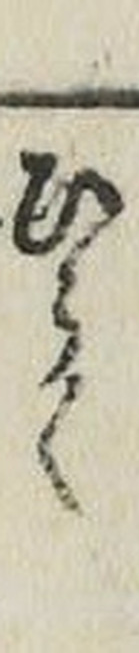ひらく
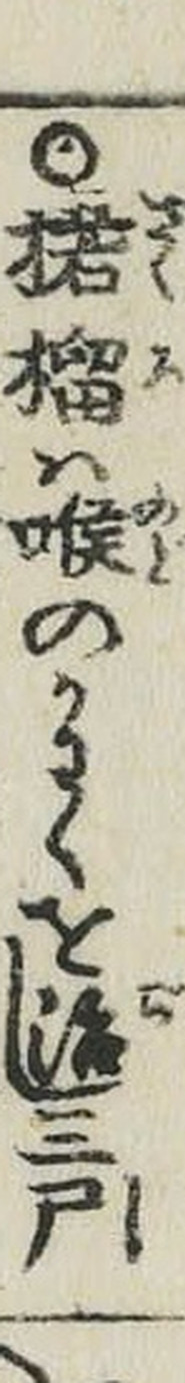○楉榴は喉のかわくを治し三尸
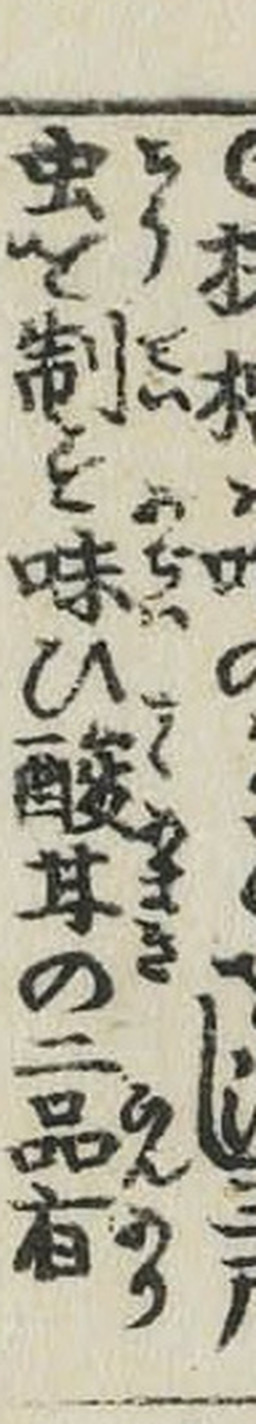虫を制す味ひ酸甘の二品有
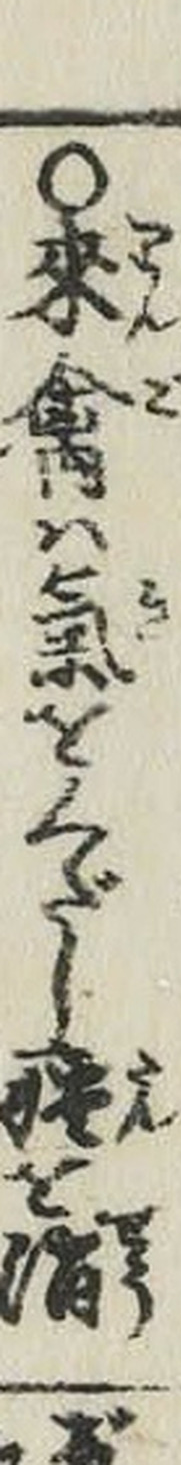○来禽は気をくだし痰を消
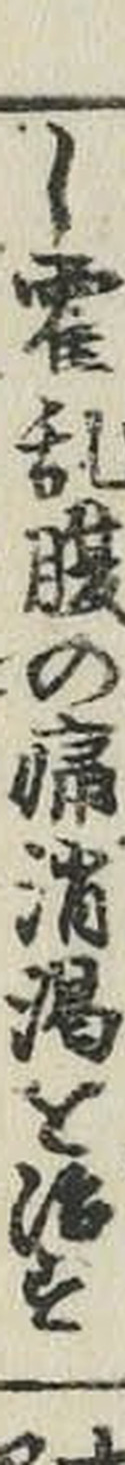し霍乱腹の痛消渇を治す
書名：増補頭書訓蒙図彙大成 10巻 8:巻之17-19
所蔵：東京学芸大学教育コンテンツアーカイブ
